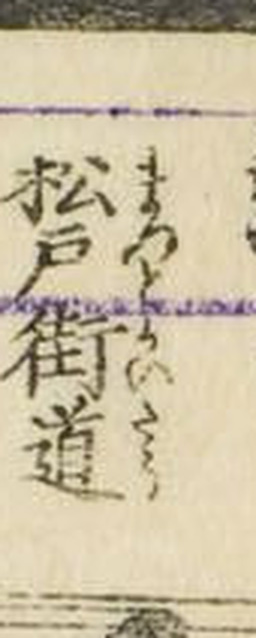松戸街道
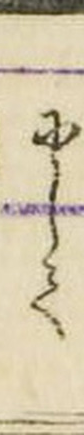にして
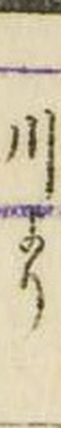川より
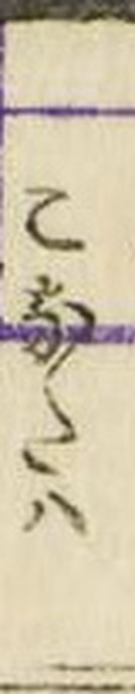こなたへ
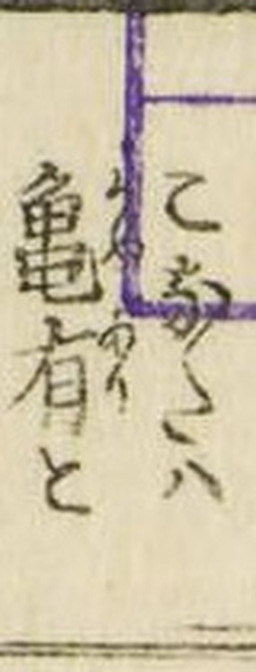亀有と
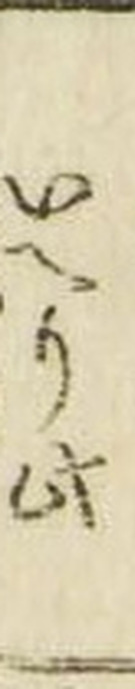いへり此
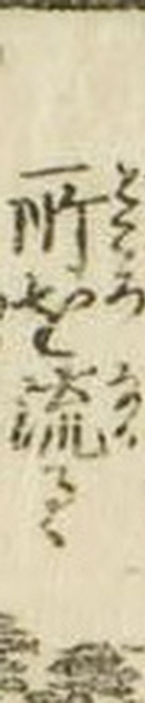所を流るゝ
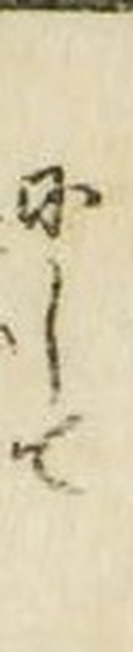にして
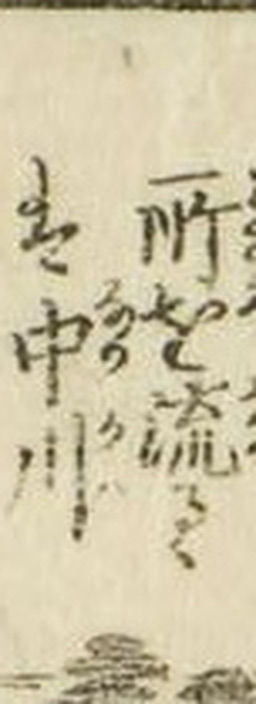は中川
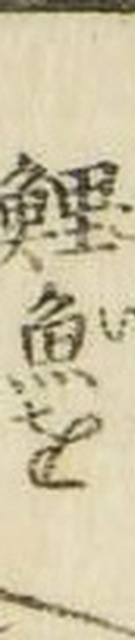鯉魚を

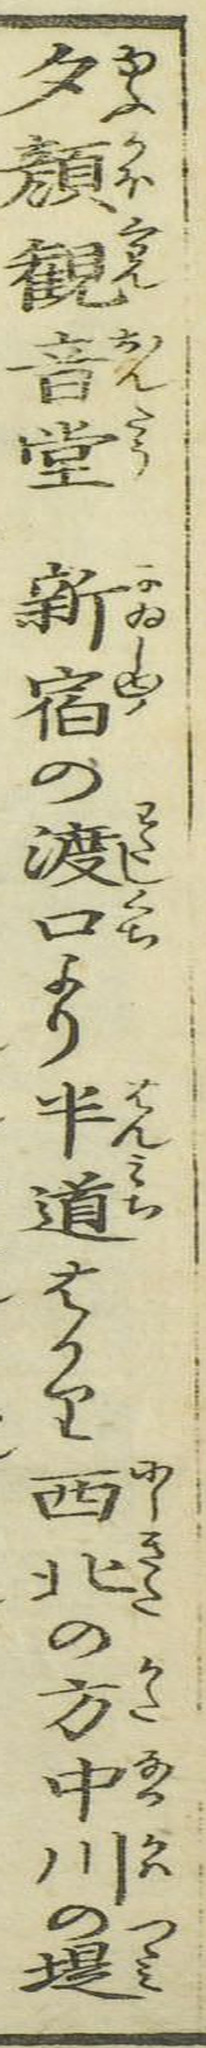夕顔観音堂新宿の渡口より半道はかり西北の方中川の堤
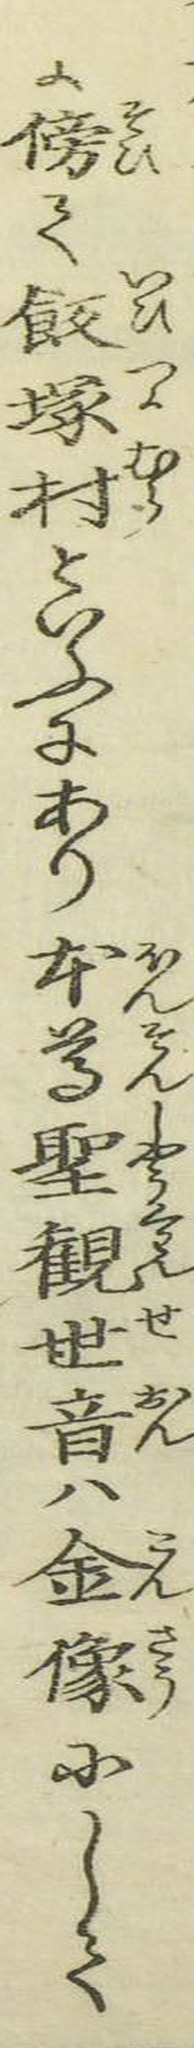に傍て飯塚村といふにあり本尊聖観世音は金像にして
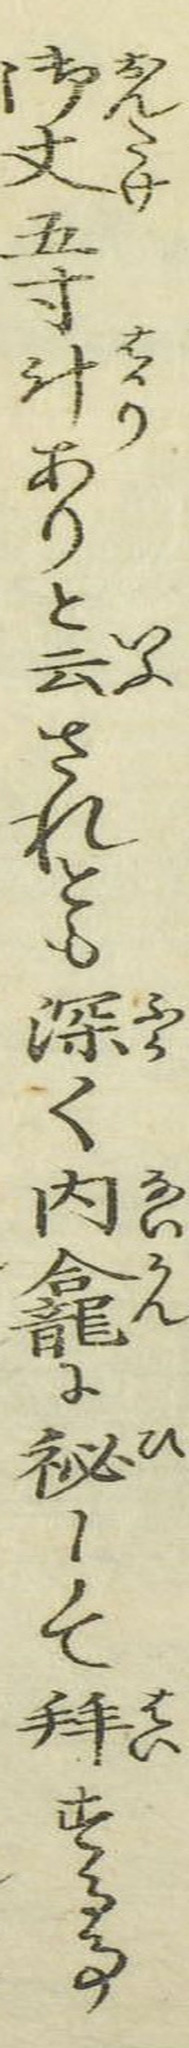御丈五寸計ありと云されとも深く内龕に秘して拝する事
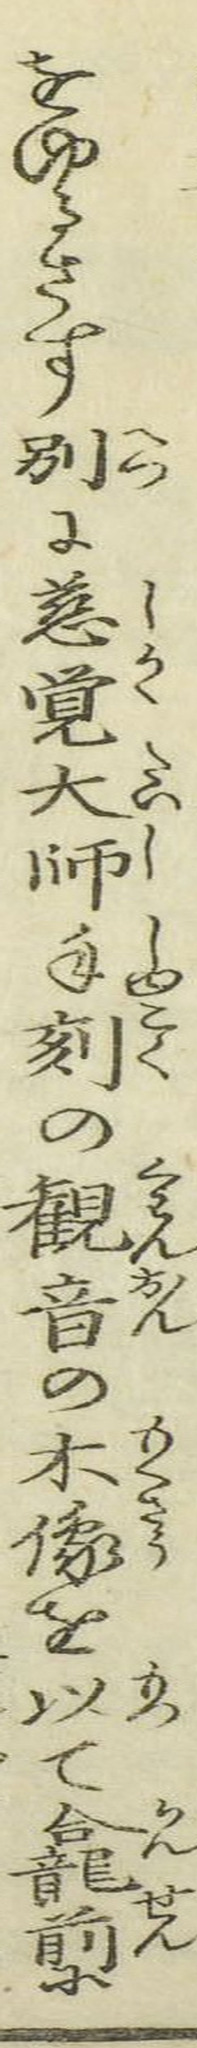をゆるさす別に慈覚大師手刻の観音の木像を以て龕前に
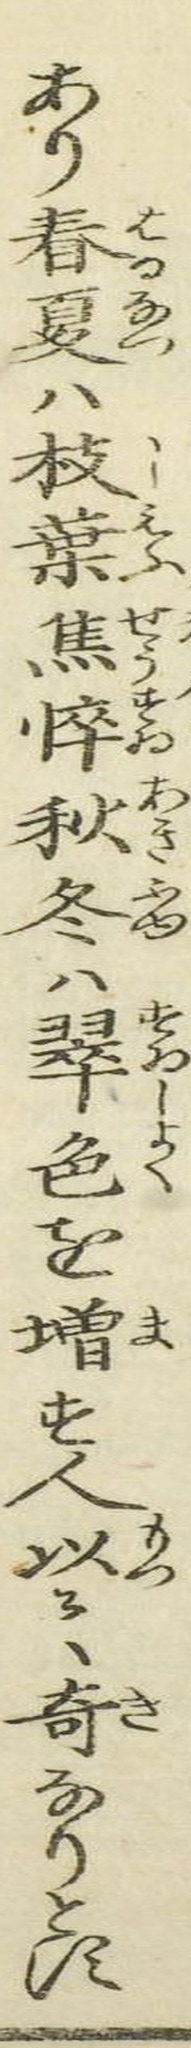あり春夏は枝葉憔悴秋冬は翠色を増す人以て奇なりとす
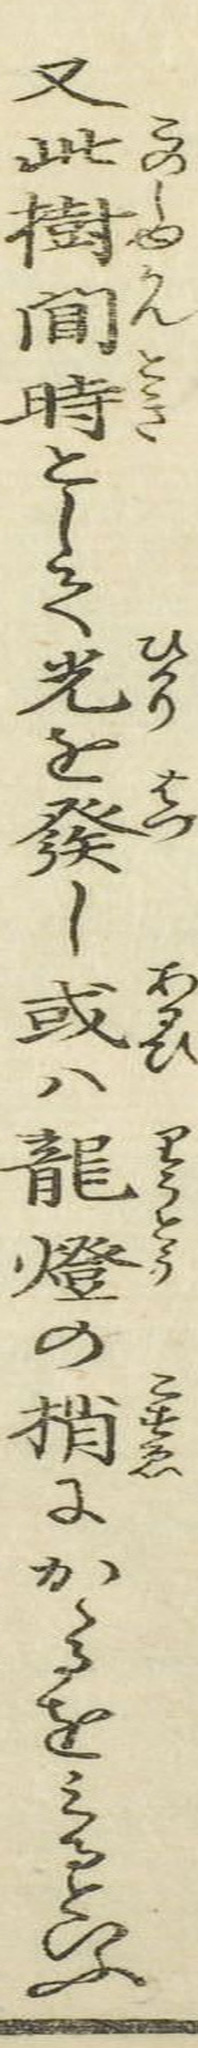又此樹間時として光を発し或は龍燈の梢にかゝるをみるといふ
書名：江戸名所図会 20巻 巻之20
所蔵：東京学芸大学教育コンテンツアーカイブ
